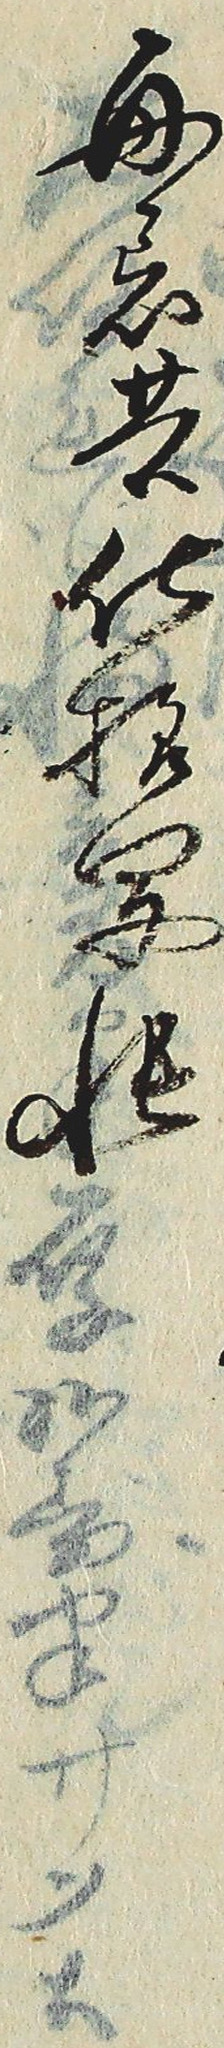舟着共仕様写帳
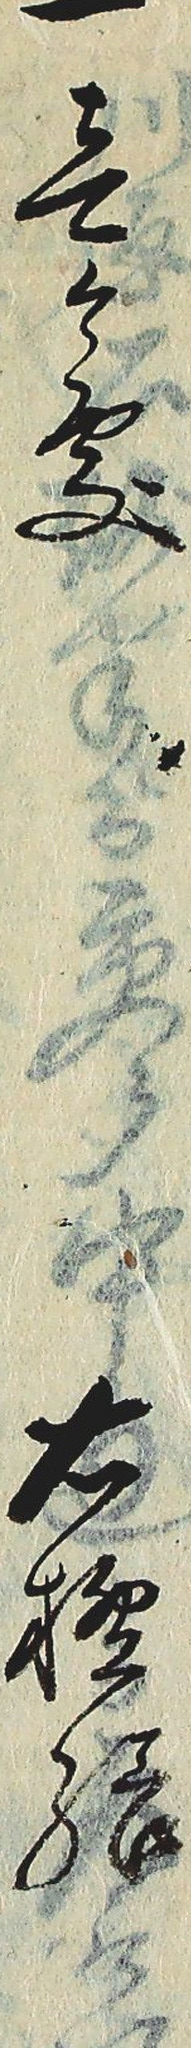一壱ヶ処右檀繕
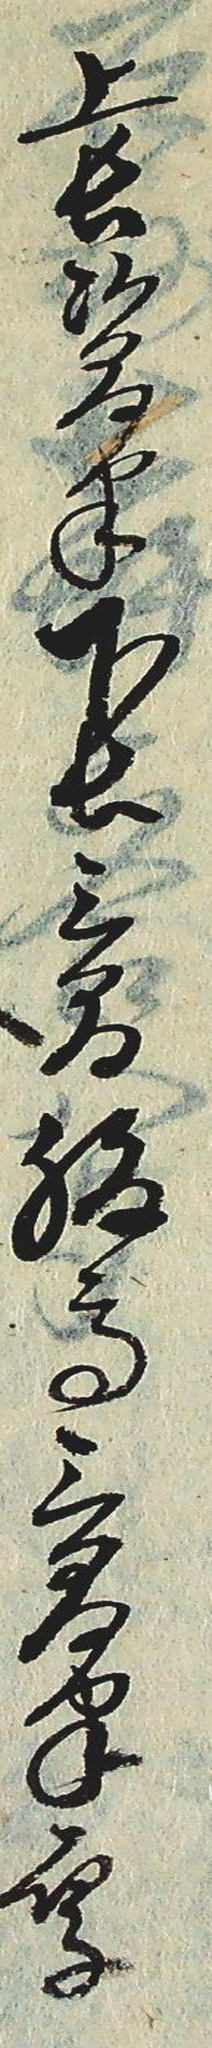上長弐間半下長三間腹高三間半厚
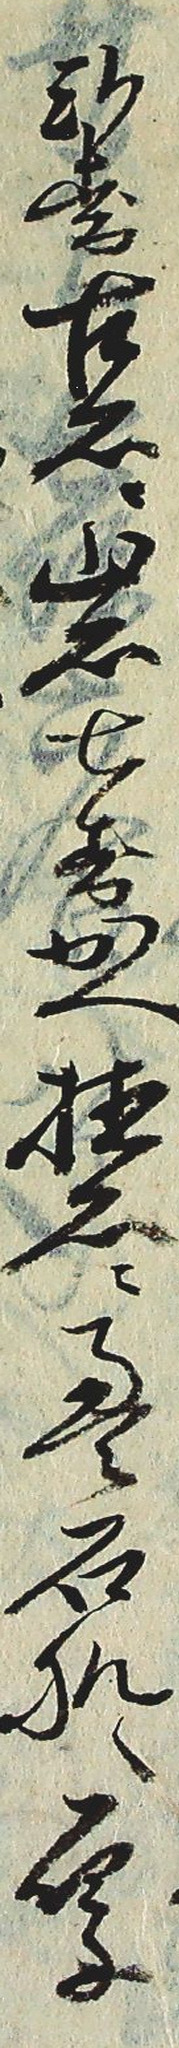弐歩古石に岩七歩加へ植石に畳石肌へ厚
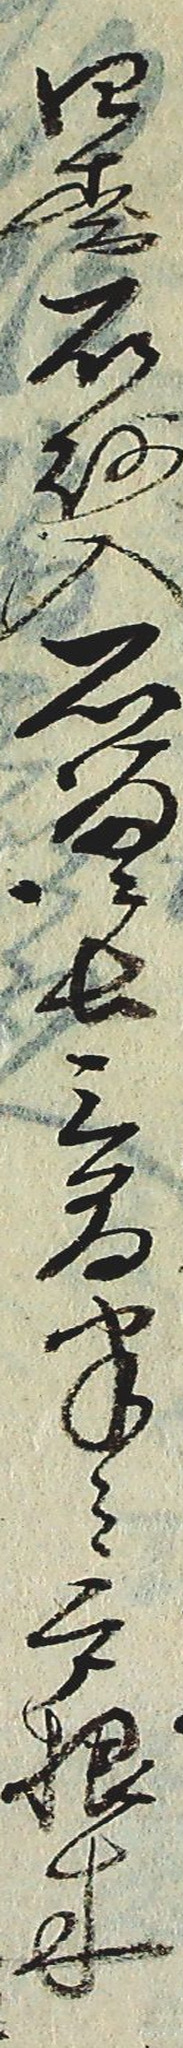四歩石砂入石留に長三間半之戸根木
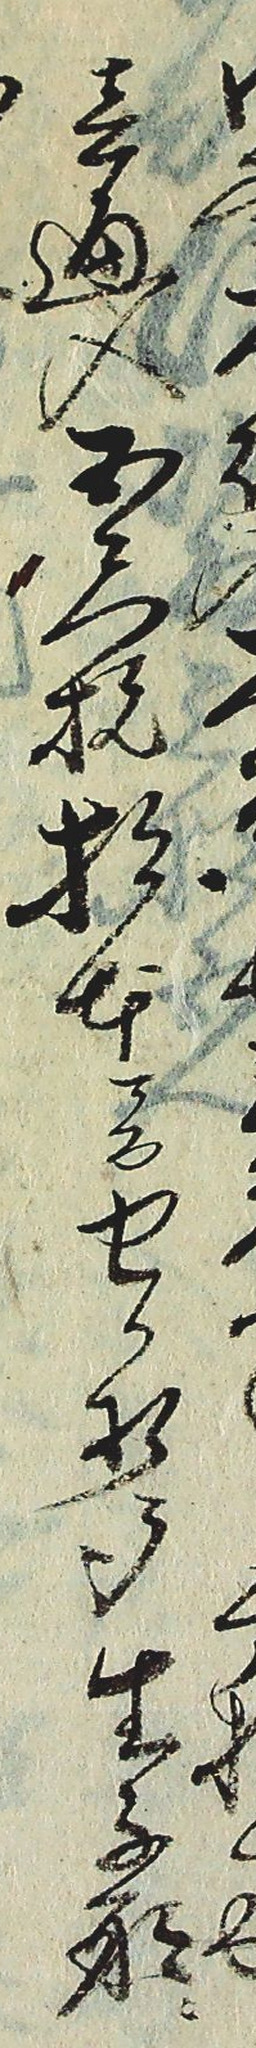壱通入五尺杭拾本にてせり打にして生子形に
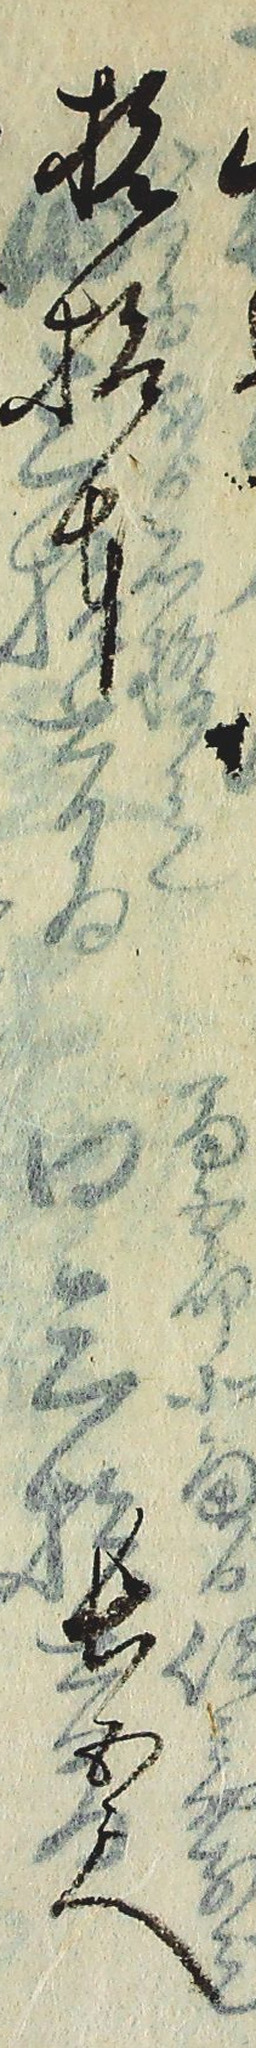杭拾本長五尺
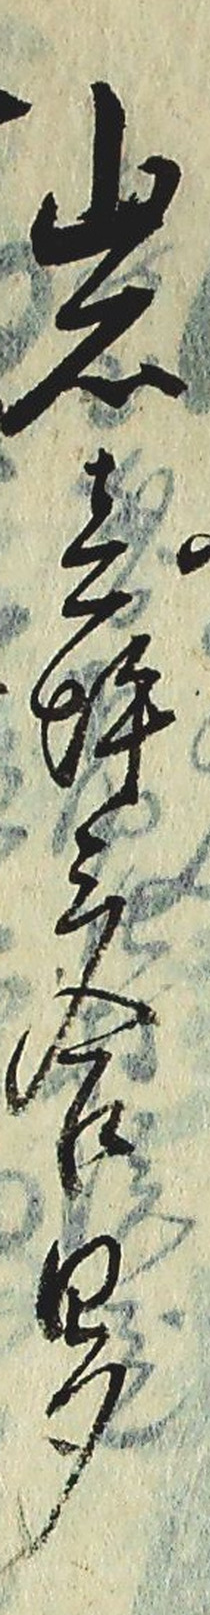岩壱坪三合四勺
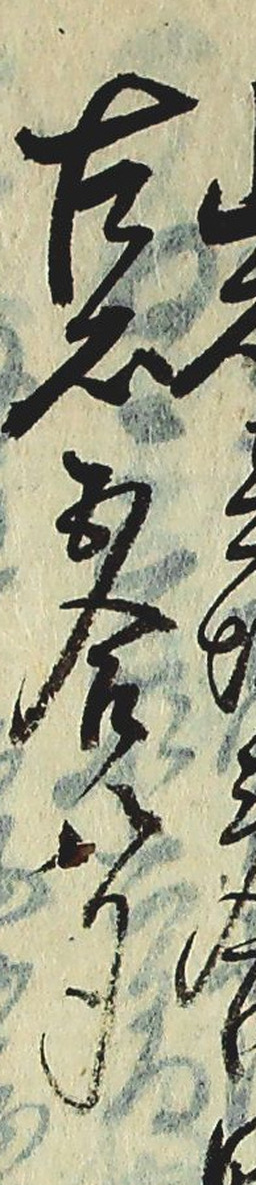古石五合八勺
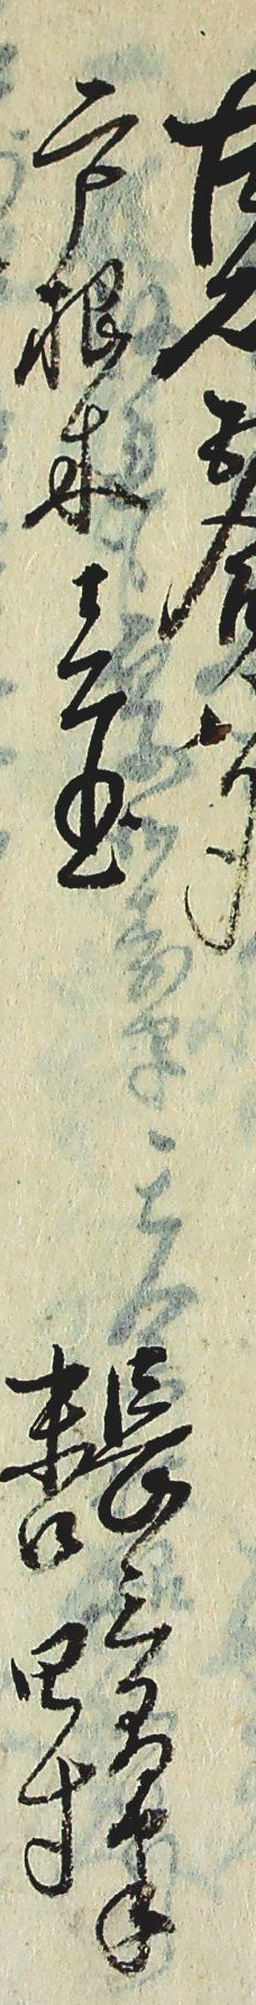戸根木壱本長三間半
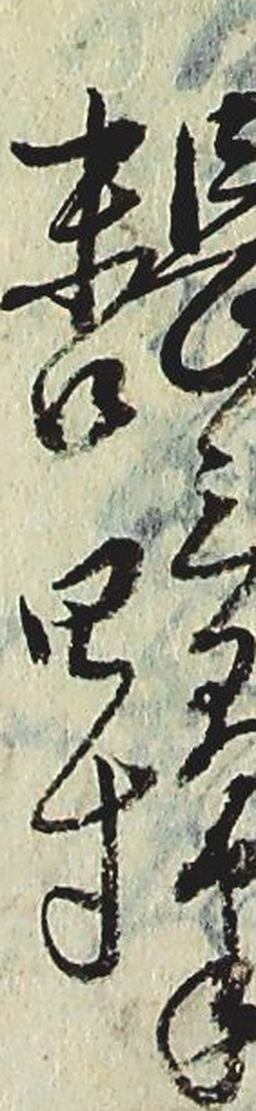末口四寸
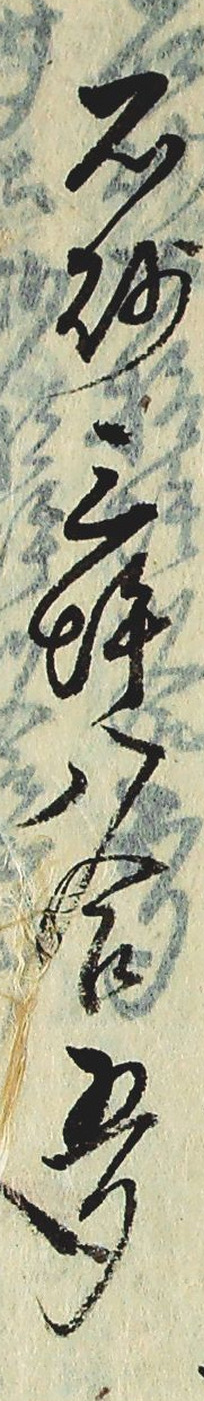石砂三坪八合五勺
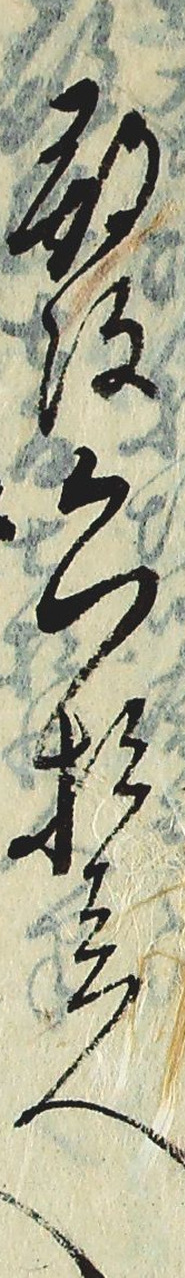郡役六拾壱人
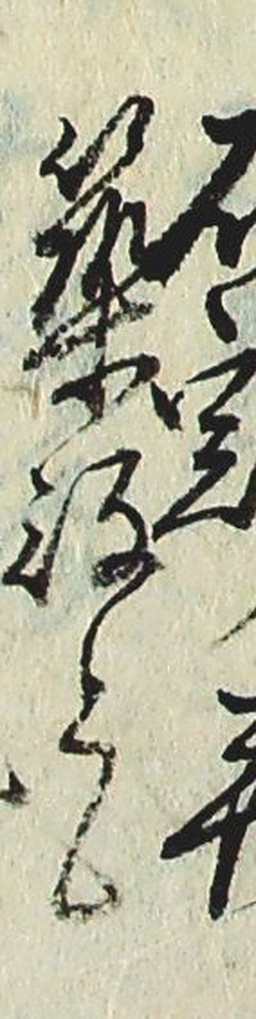築役とも
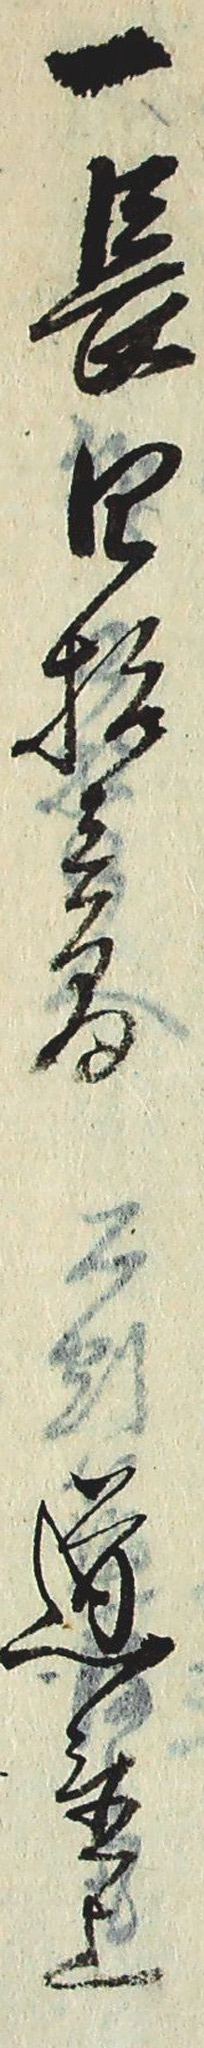一長四拾壱間道置上

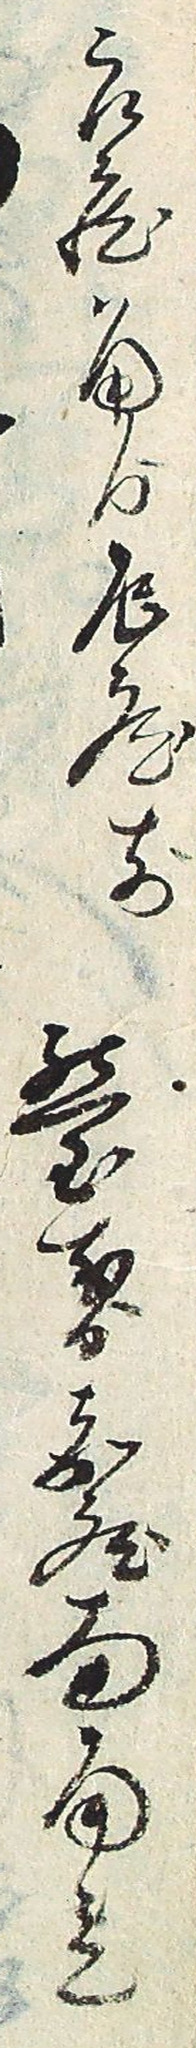庄蔵角ゟ辰蔵前瑩前ゟ嘉蔵南角迄
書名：名東郡中諸割賦元帳
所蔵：鳴門教育大学 Naruto University of Education
